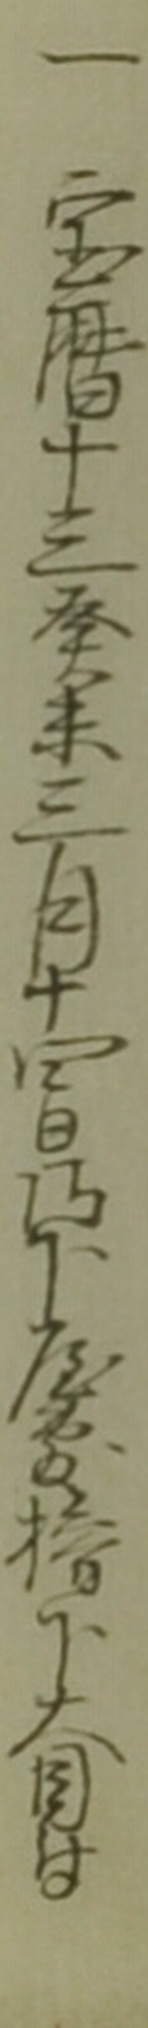一宝暦十三癸未三月十四日御下屋敷◻︎下大目付
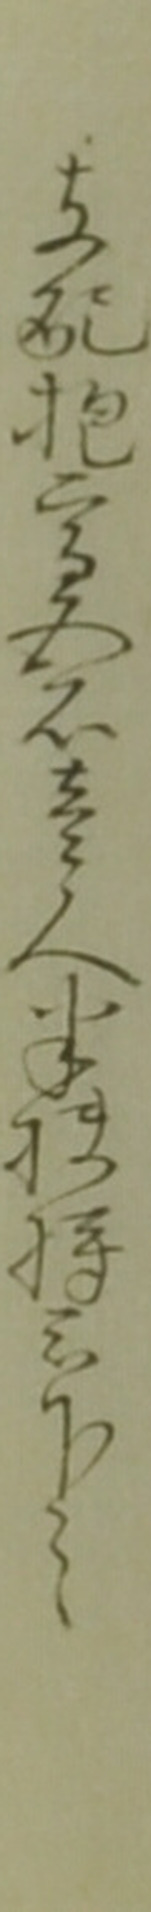支配抱高五石壱人半扶持被下之

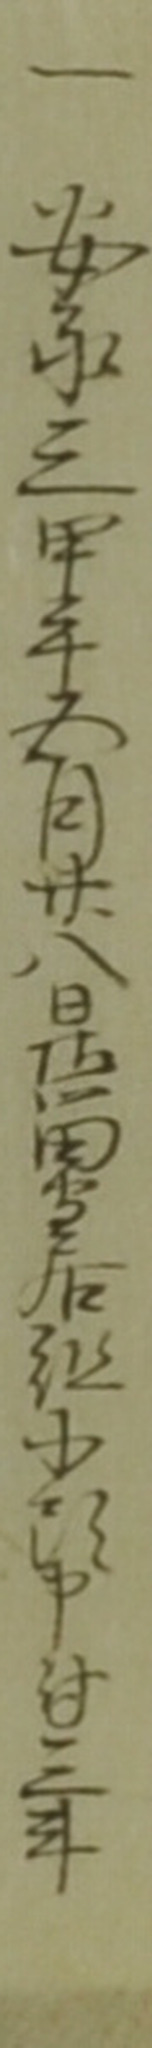一安永三甲午五月廿八日御留守居組小頭申付三斗
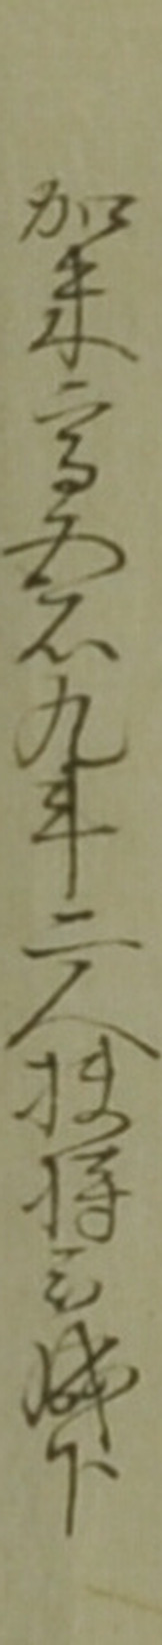加米高五石九斗二人扶持被成下
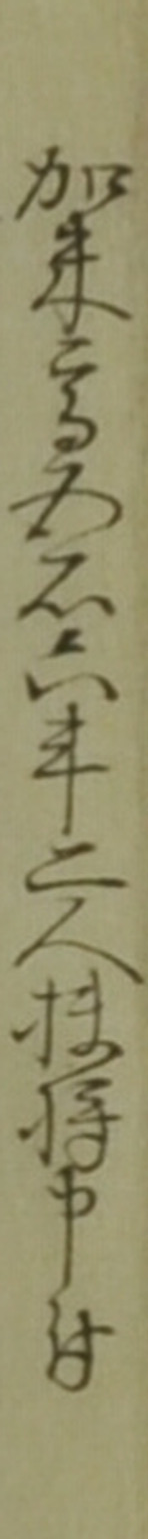加米高五石六斗二人扶持申付
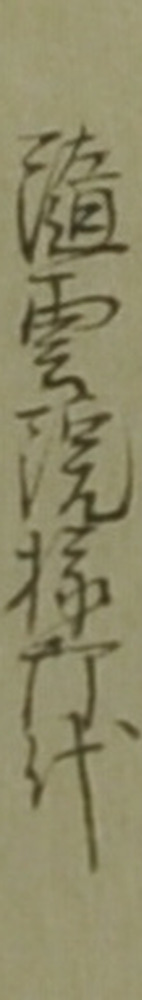随雲院様御代
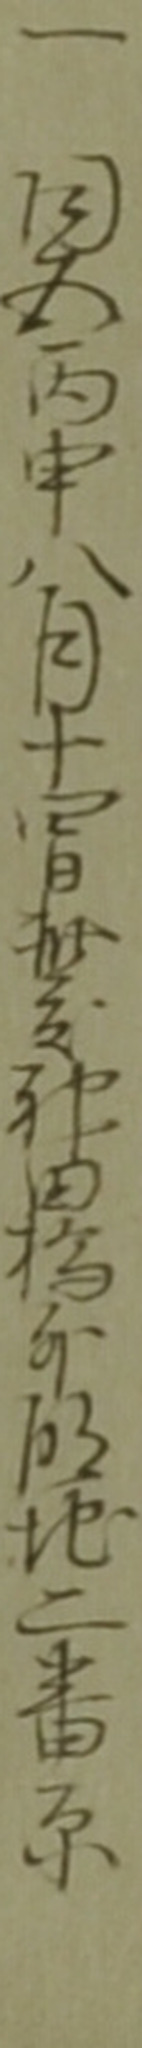一同五丙申八月十四日此度神田橋外明地二番原
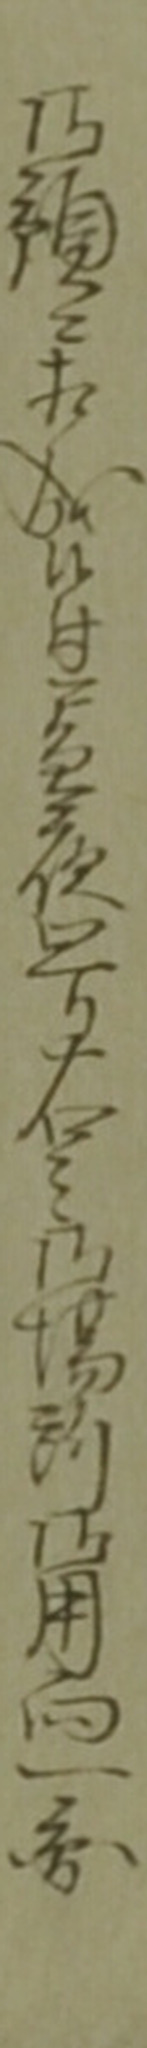御預ニ相成候付昼夜廻り右之御場所御用向一円
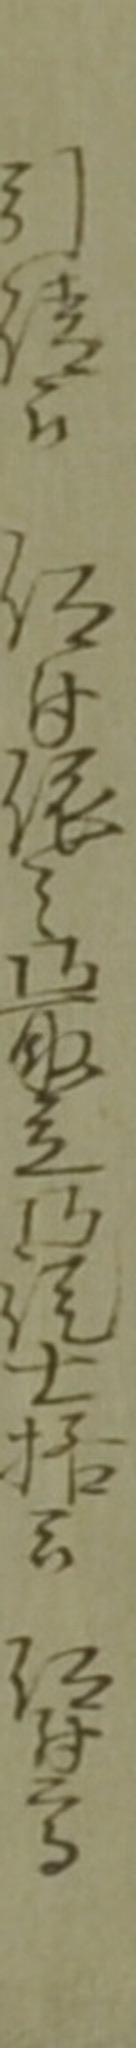引請被仰付依之御取立御徒士格被仰付高
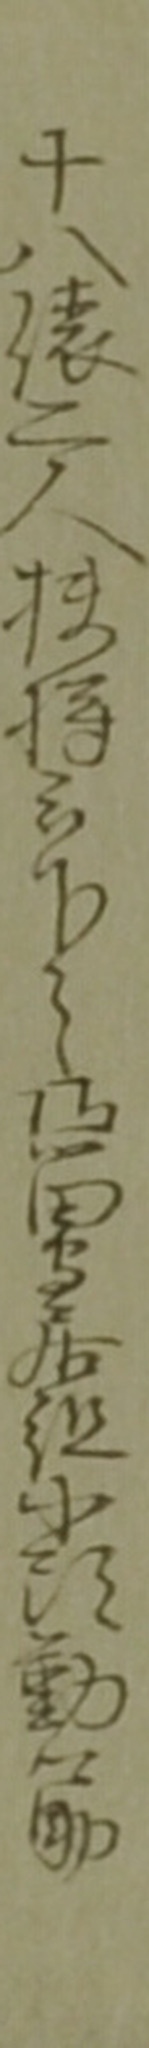十八俵二人扶持被下之御留守居組小頭勤筋
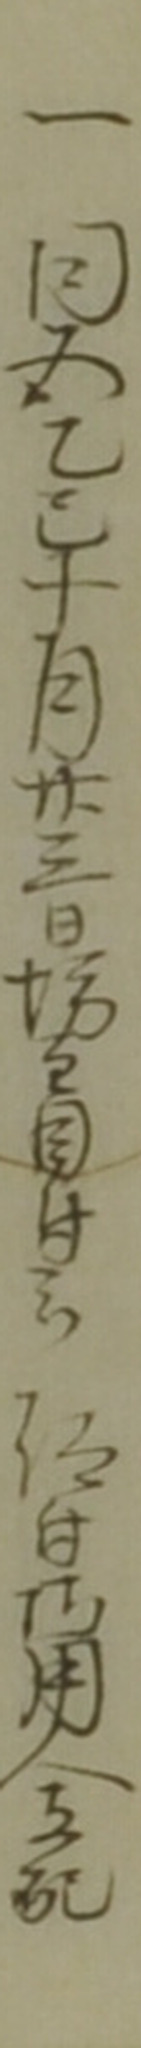一同五乙巳十月廿三日坊主目付被仰付御用人支配
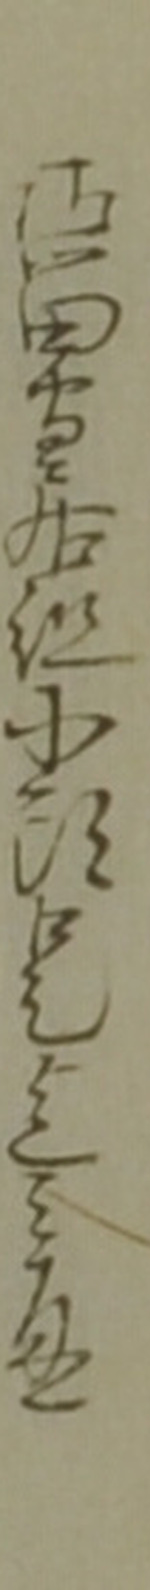御留守居組小頭是迄之通
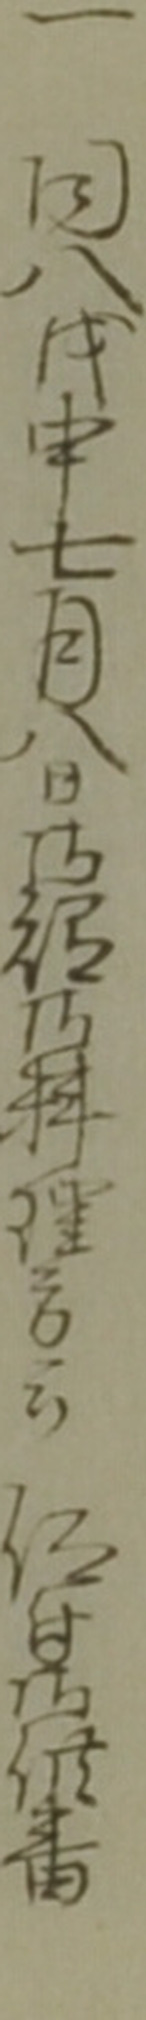一同八戊申七月八日御賄御料理方被仰付御供番
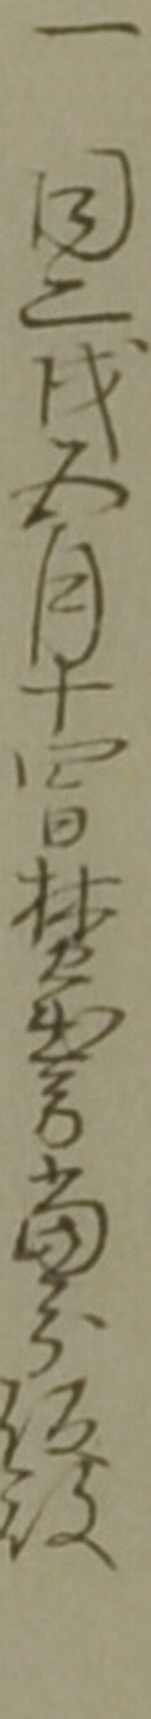一同二戌五月十四日焚出方当分仮役
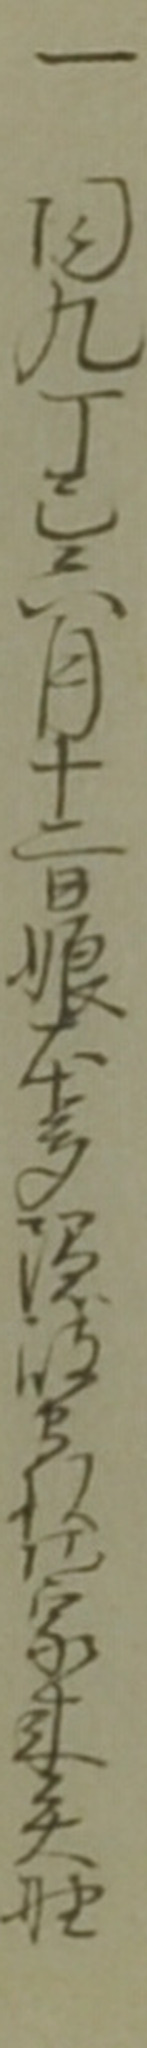一同九丁巳六月十二日娘本多隠岐守様御家来矢野
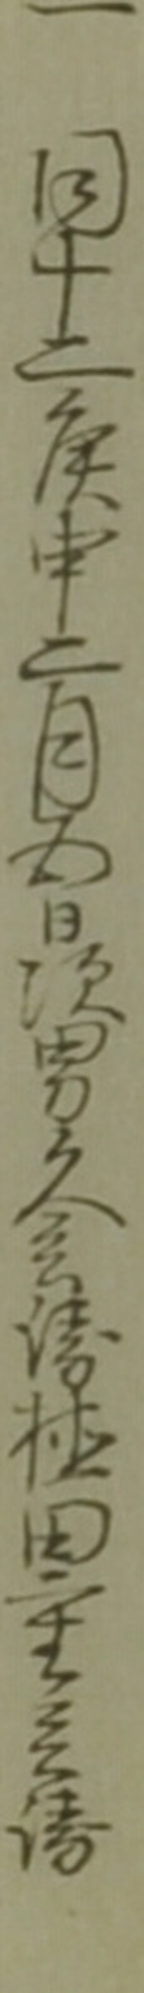一同十二庚申二月五日次男久兵衛植田重兵衛
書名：無足諸士勤仕録（九）
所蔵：伊那市立高遠町図書館・合同会社AMANE
